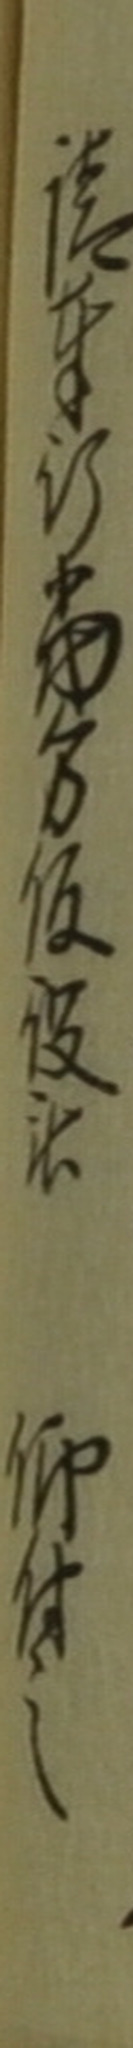請奉行当分仮役被仰付之
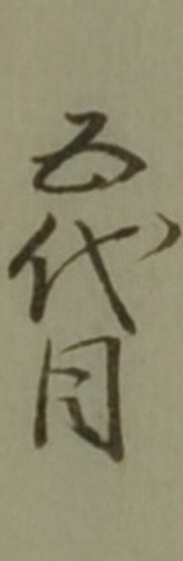五代目
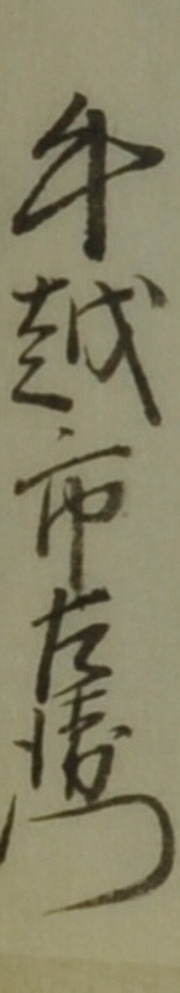牛越市左衛門
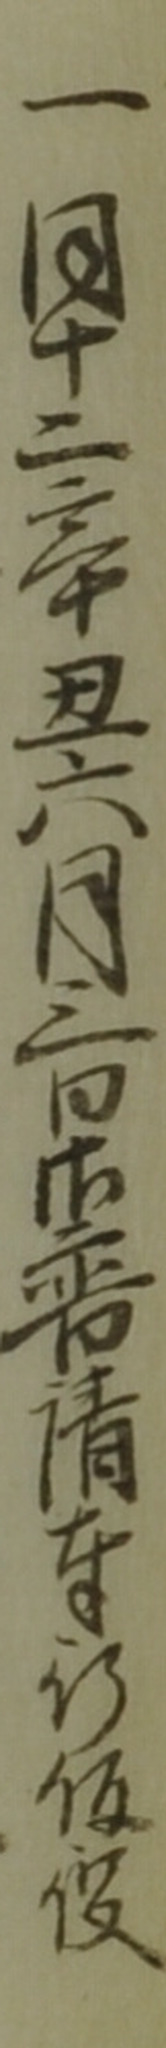一同十二辛丑六月三日御普請奉行仮役
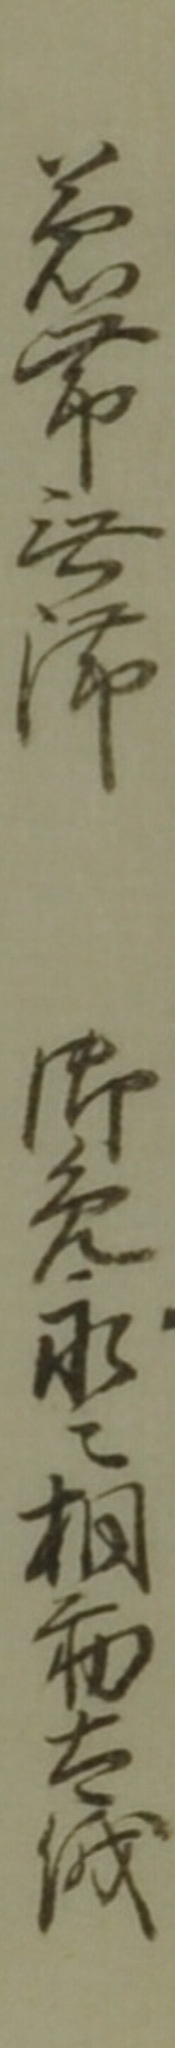兼帯無滞御免永ニ相勤左儀
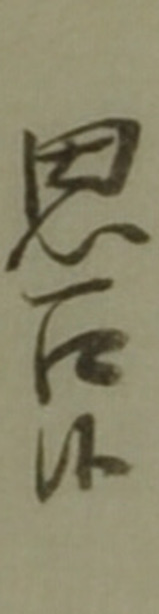思召候
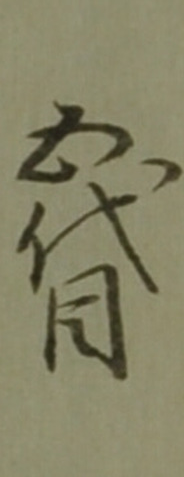五代目
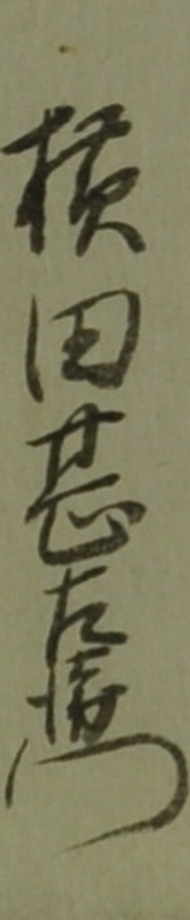横田甚左衛門
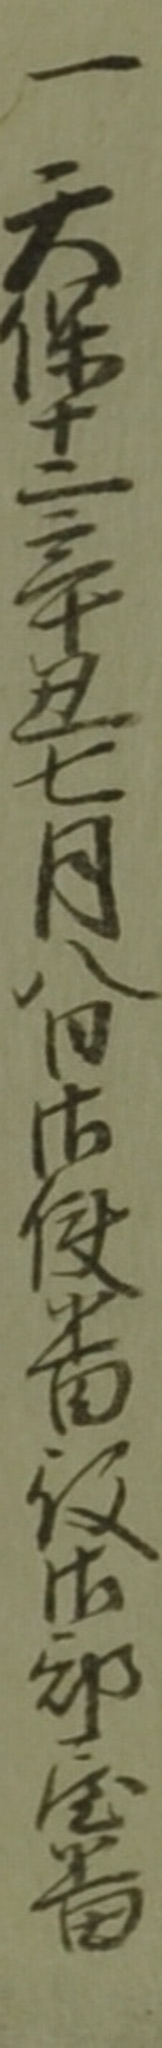一天保十二辛丑七月八日御使番役御部屋番
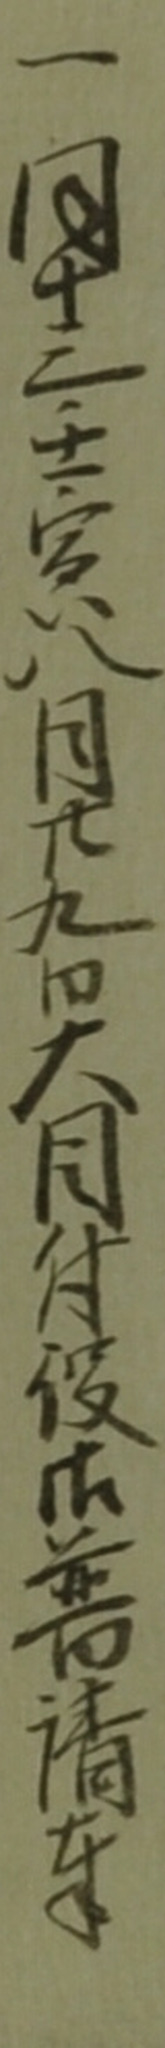一同十二壬寅八月廿九日大目付役御普請奉
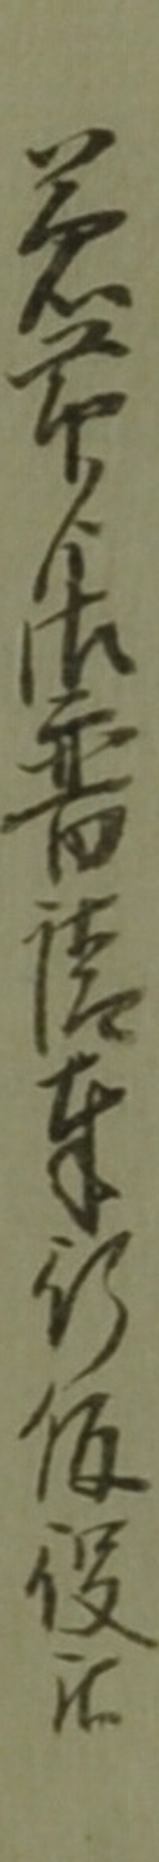兼帯ゟ御普請奉行仮役被
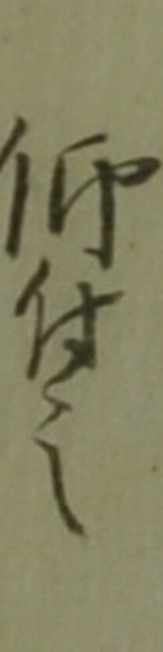仰付之
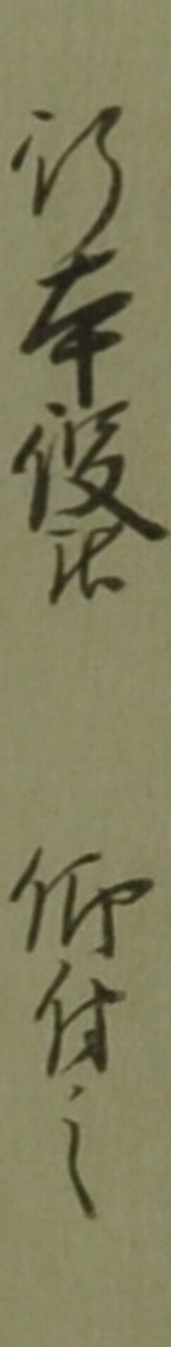行本役被仰付之

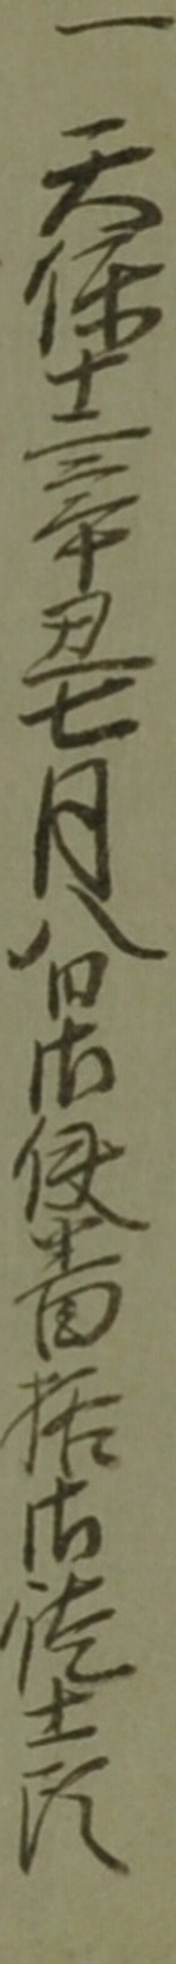一天保十二辛丑七月八日御使番格御徒士頭
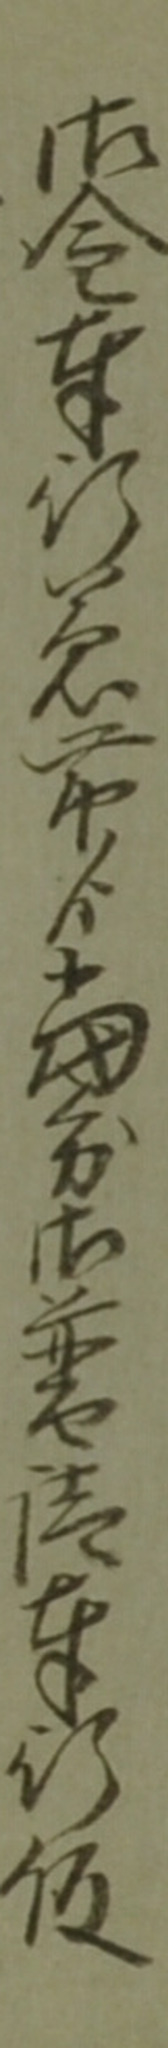御金奉行兼帯ゟ当分御普請奉行仮
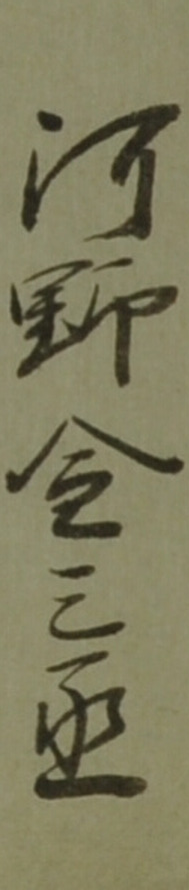河野金三丞
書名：諸御役代々録（六）
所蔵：伊那市立高遠町図書館・合同会社AMANE
